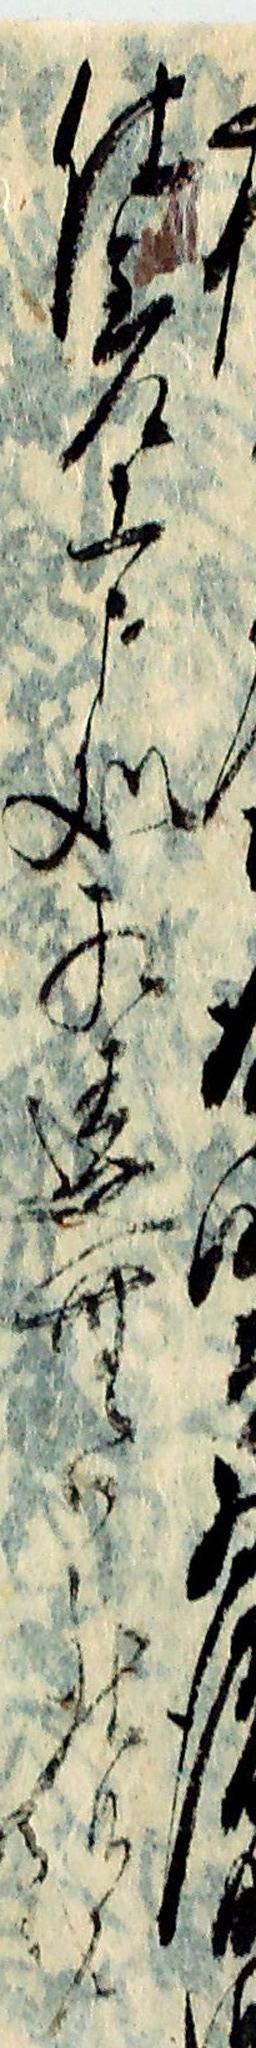仕差上申処相違無御座候以上
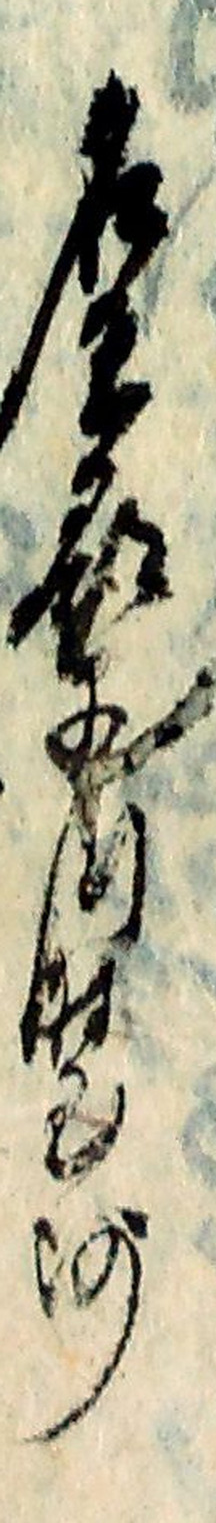名東郡早淵村玉師
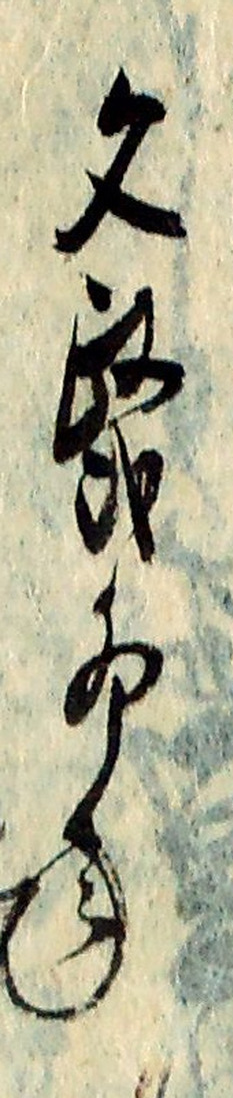文政弐卯年
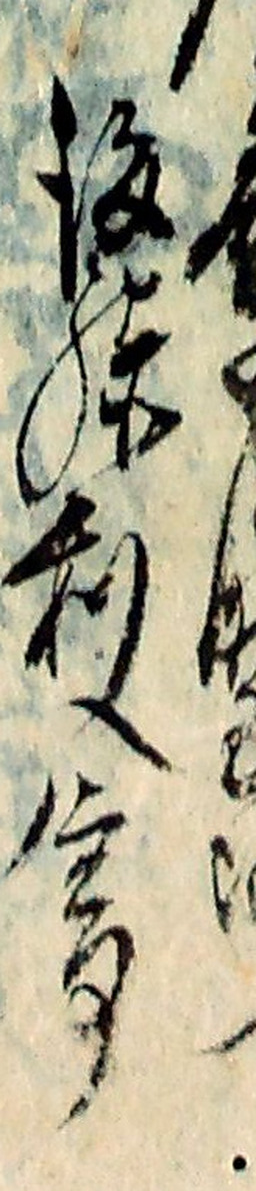後藤利八郎
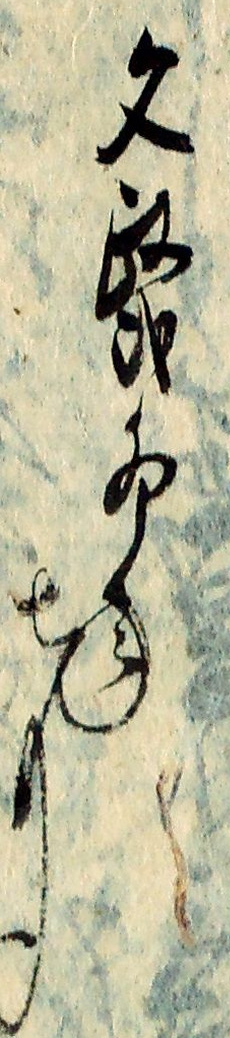文政弐卯年
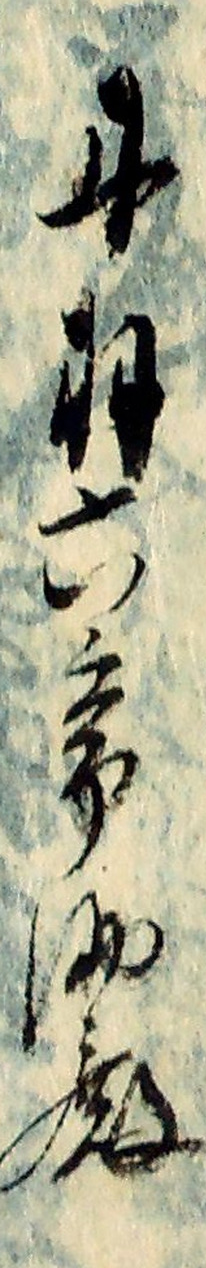丹羽六郎助殿
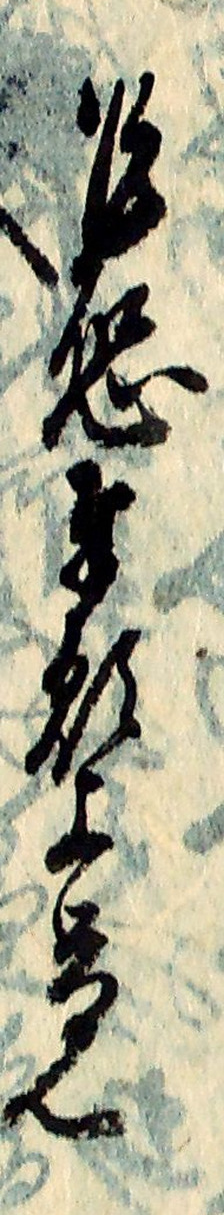乍恐奉願上覚
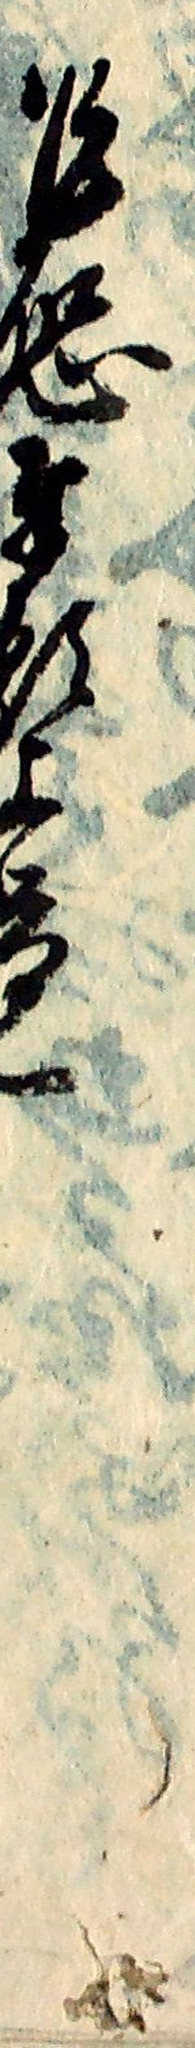乍恐奉願上覚
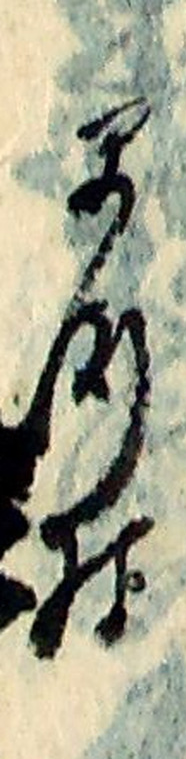早淵村
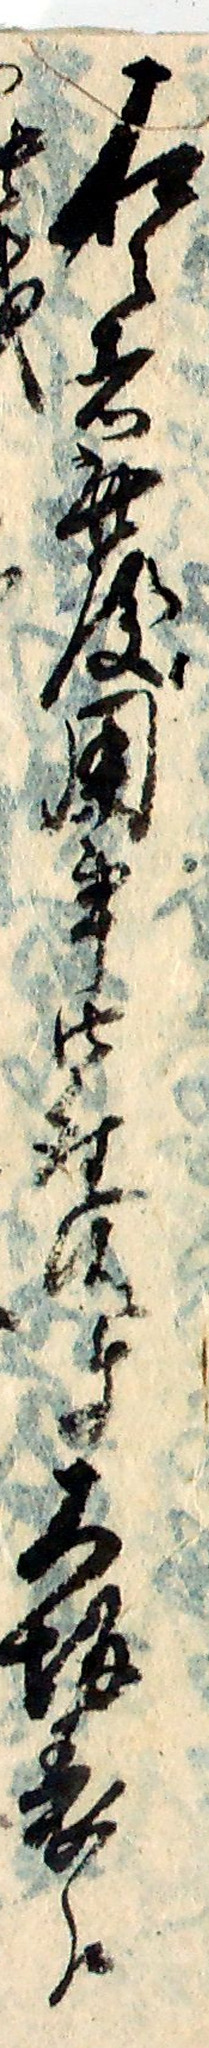右之者此度用事御座候に付大坂表え
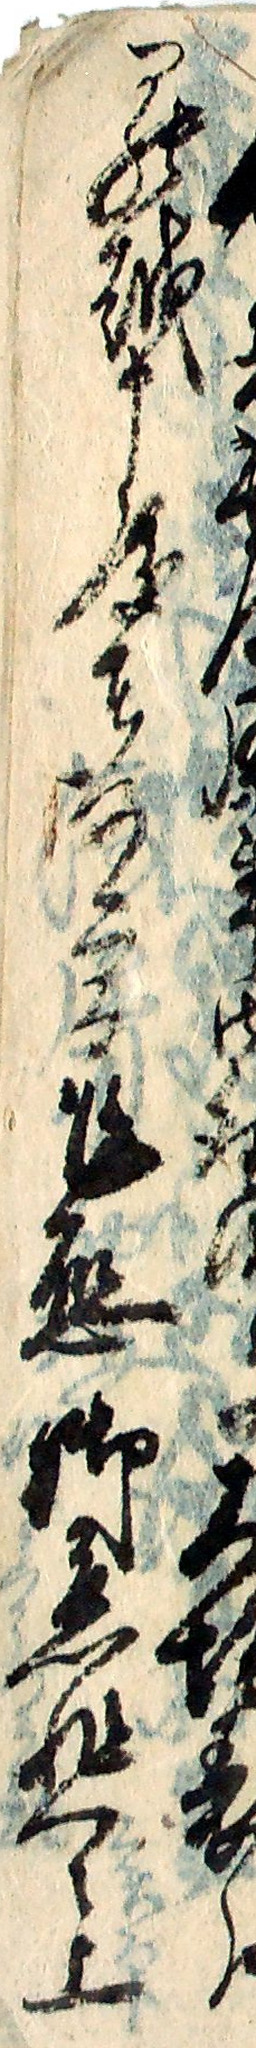罷越申度奉存上間乍恐御慈悲之上

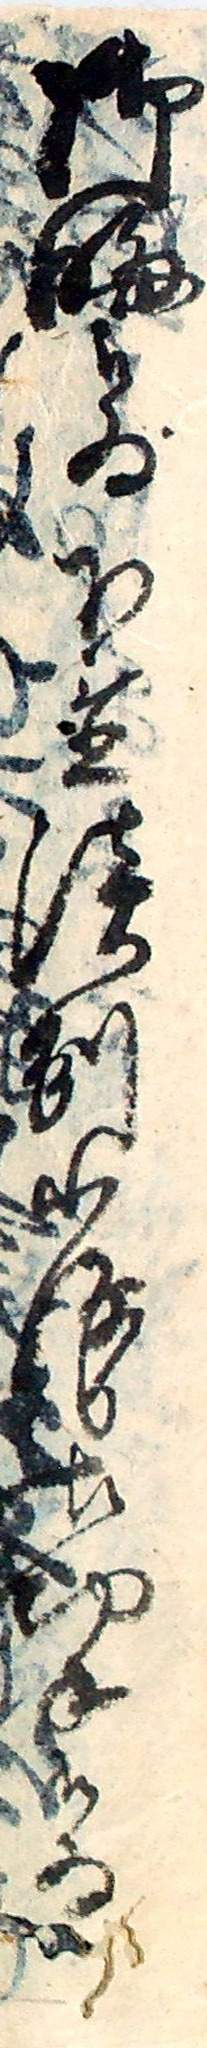御暇被為下置淡州小渡り御切手被為
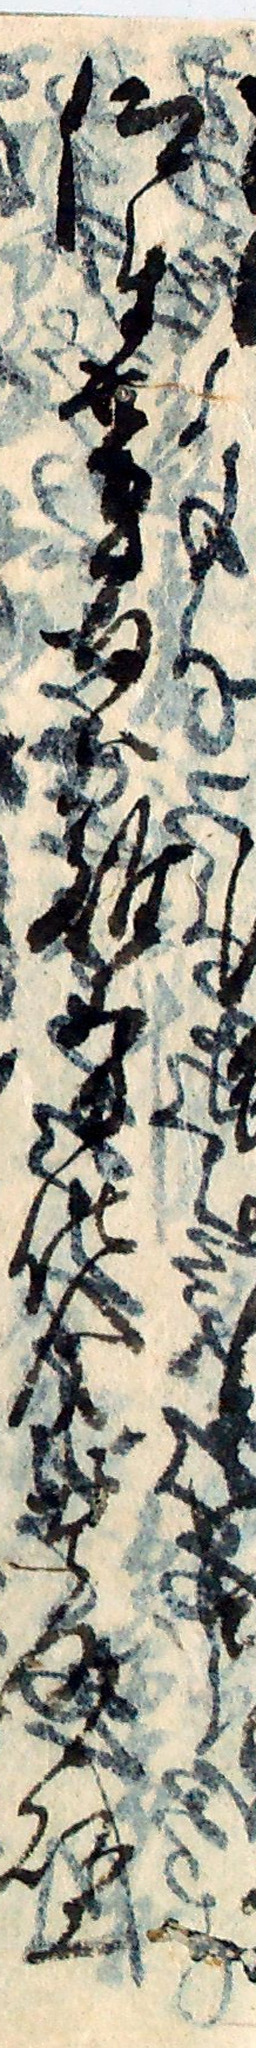仰付被下候得は難有仕合に奉存候以上
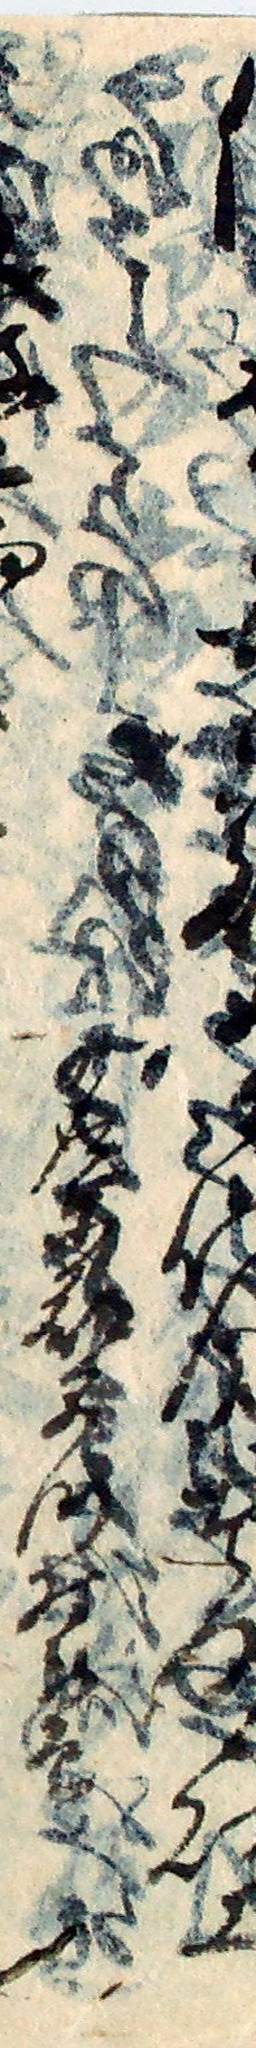名東郡早淵村庄屋
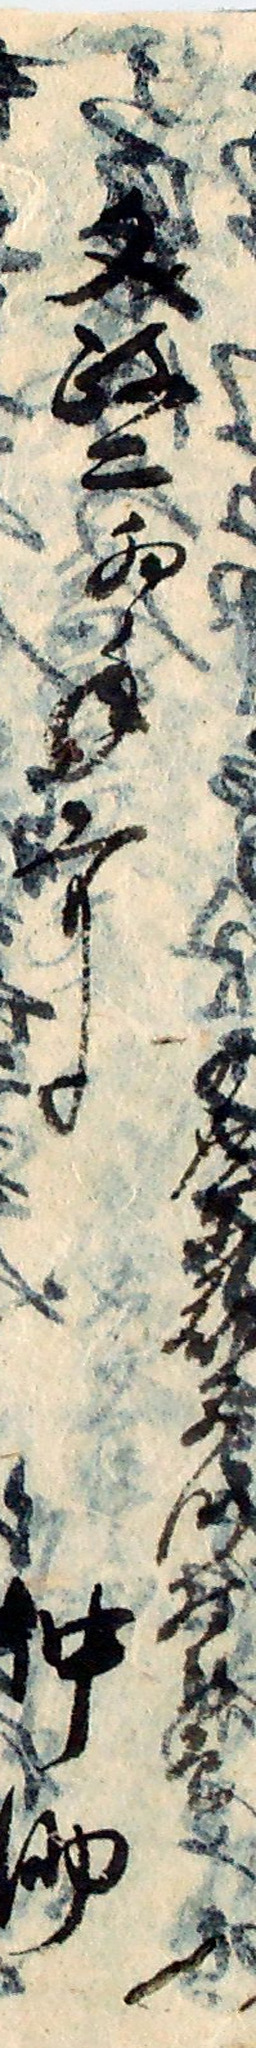文政二卯年五月仲助
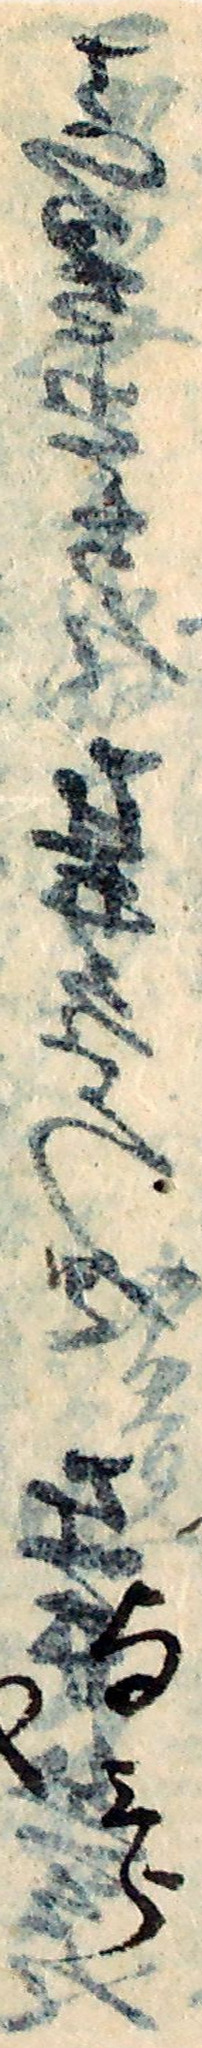与三郎
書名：諸御願書控(後藤氏壱番）
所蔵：鳴門教育大学 Naruto University of Education
